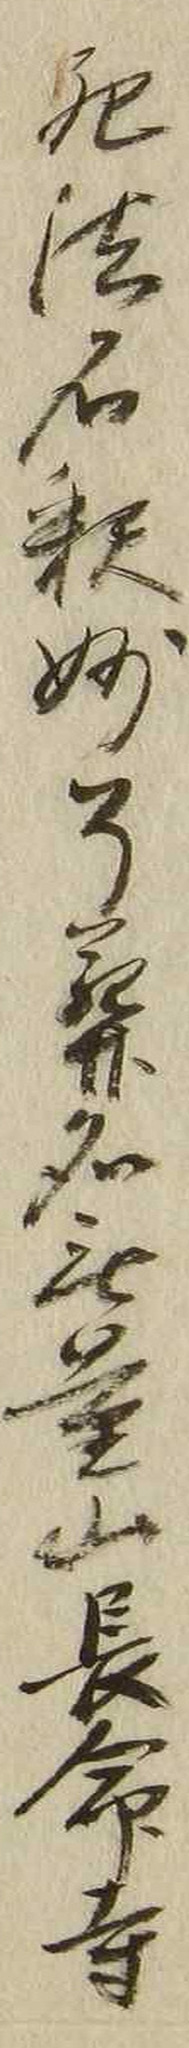死法名釈妙了葬所処無量山長命寺
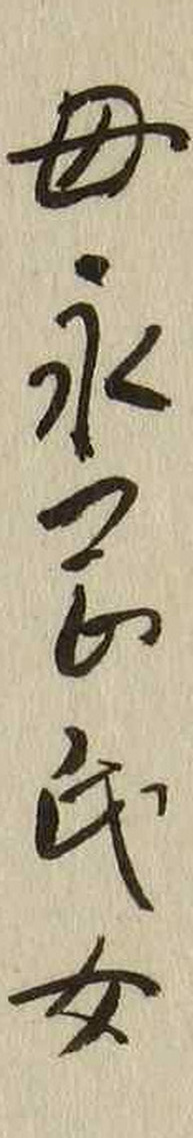母永岡氏女
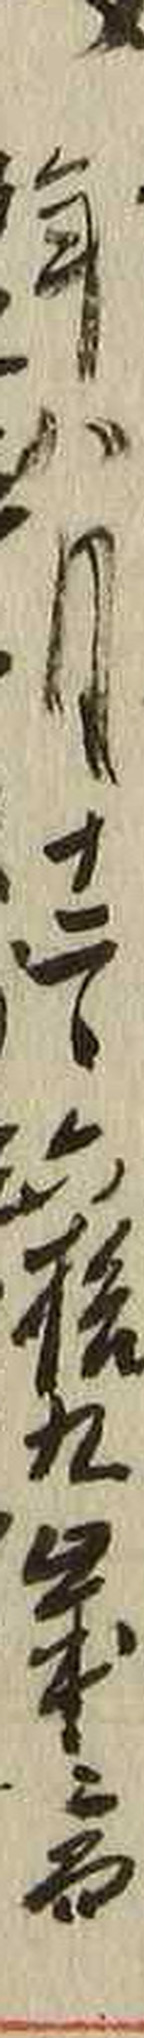年八月十二日六拾九歳に而
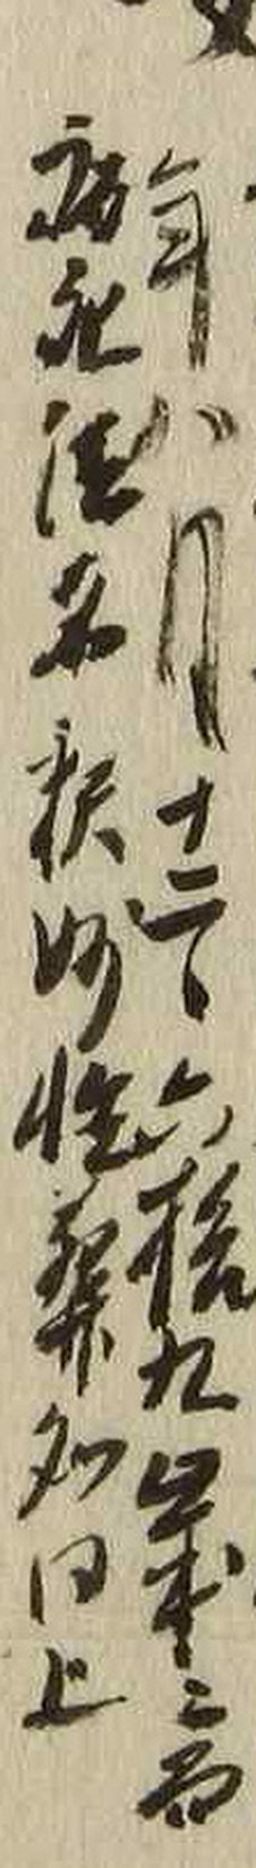病死法名釈妙性葬処同上
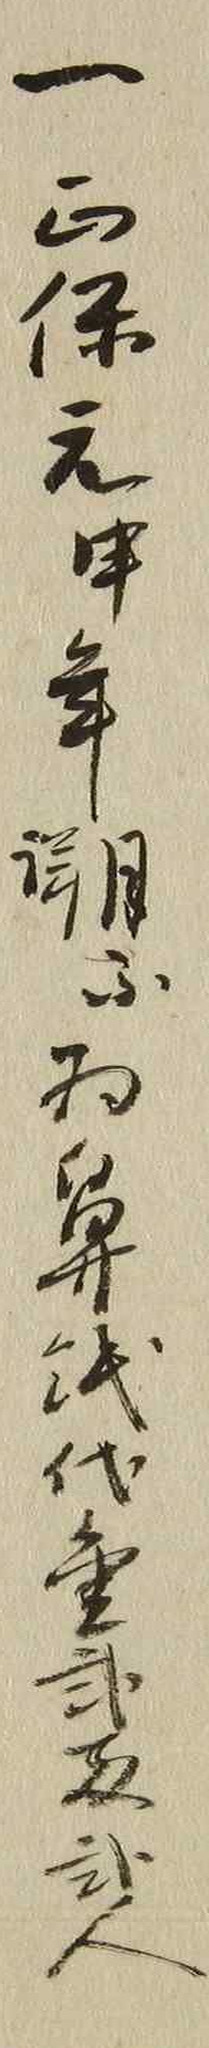一正保元申年月不詳為鼻紙代金弐両弐人
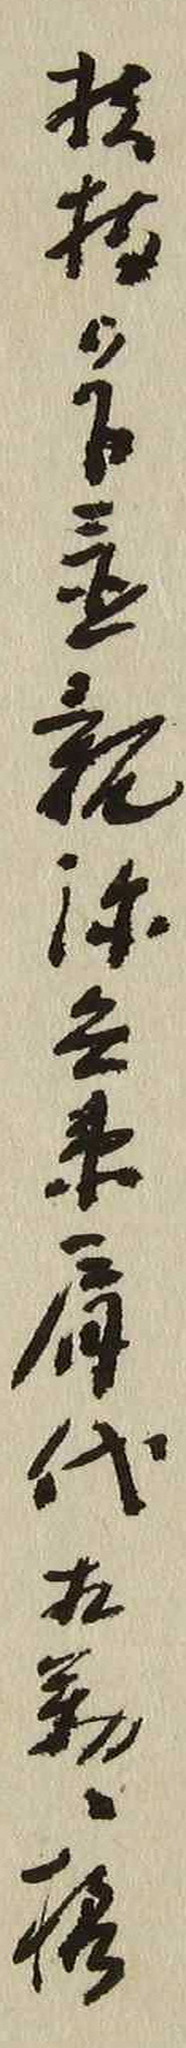扶持被下置親弥兵衛肩代相勤候様
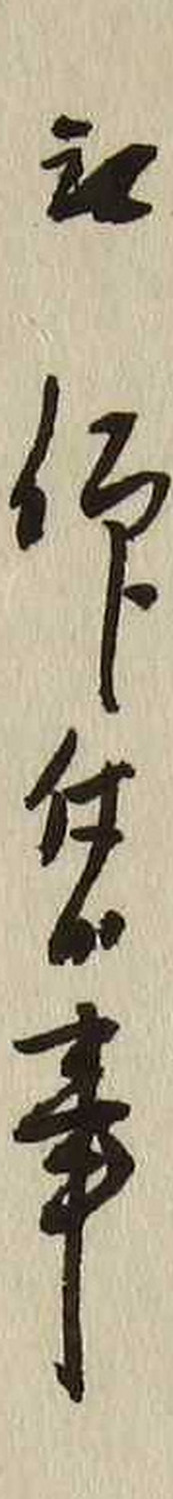被仰付候事
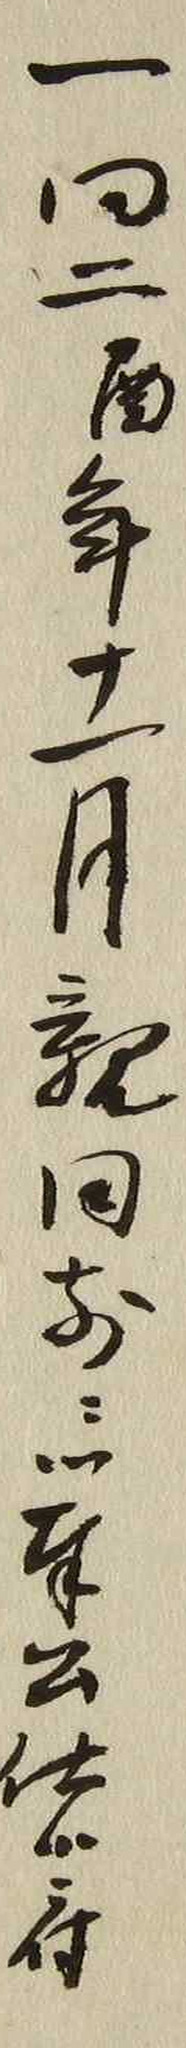一同二酉年十一月親同前に御奉公仕候に付
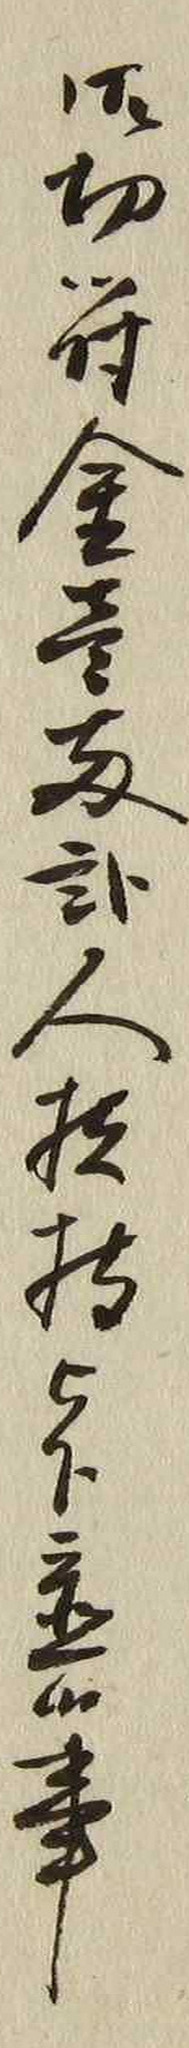御切符金壱両弐人扶持被下置候事
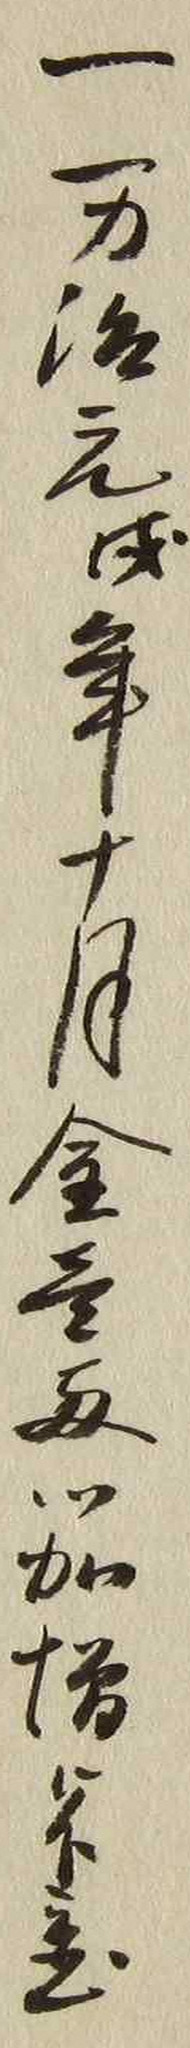一万治元戌年十月金壱両御加増被下置
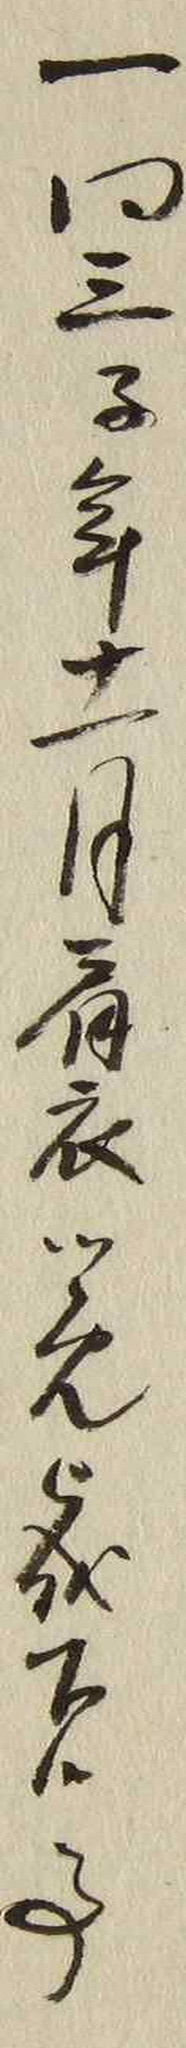一同三子年十一月肩衣御免被成候事
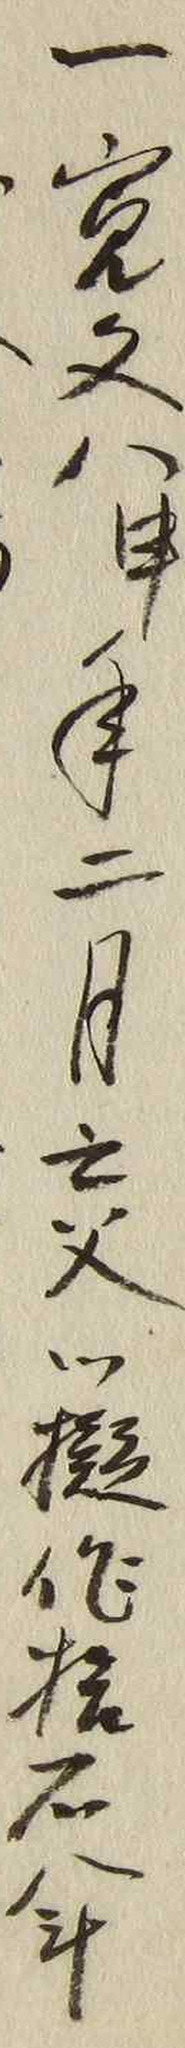一寛文八申年二月亡父御擬作拾石八斗
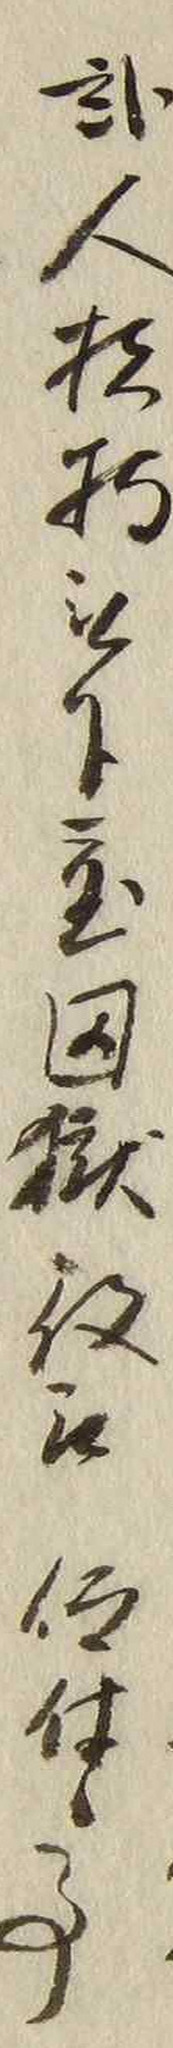弐人扶持被下置囚獄役被仰付候事
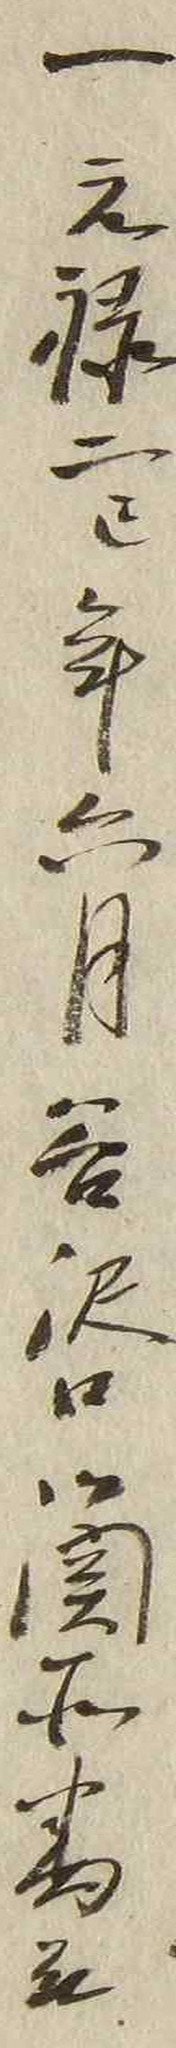一元禄二巳年六月谷沢口御関所番被

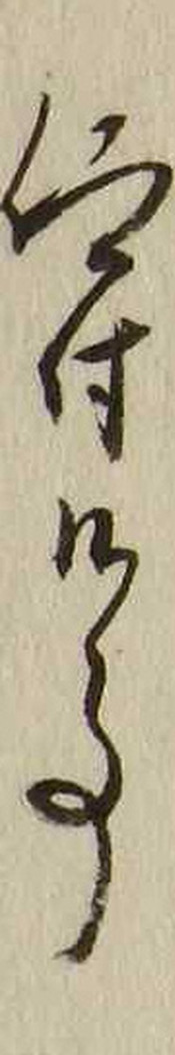仰付候事
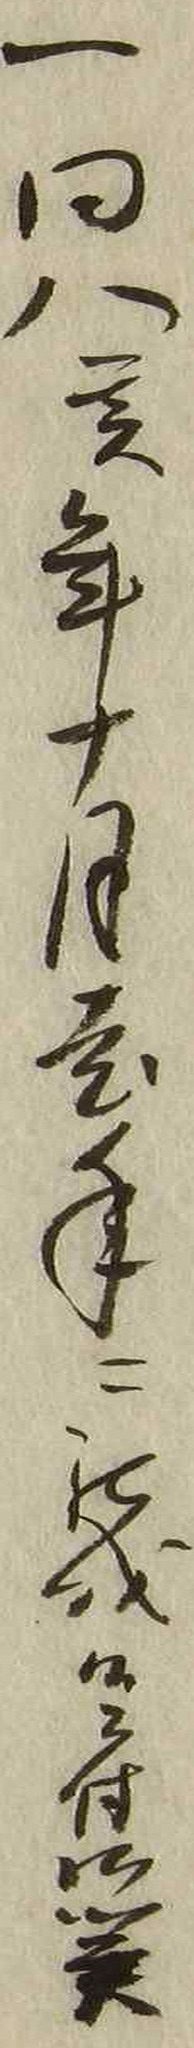一同八亥年十月老年に罷成候に付御関
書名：諸士系譜　巻之360　す之部10
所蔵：会津若松市立会津図書館
